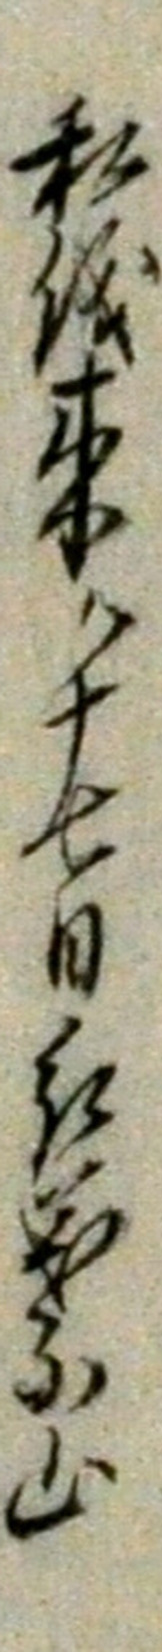私儀来ル十七日紅葉山
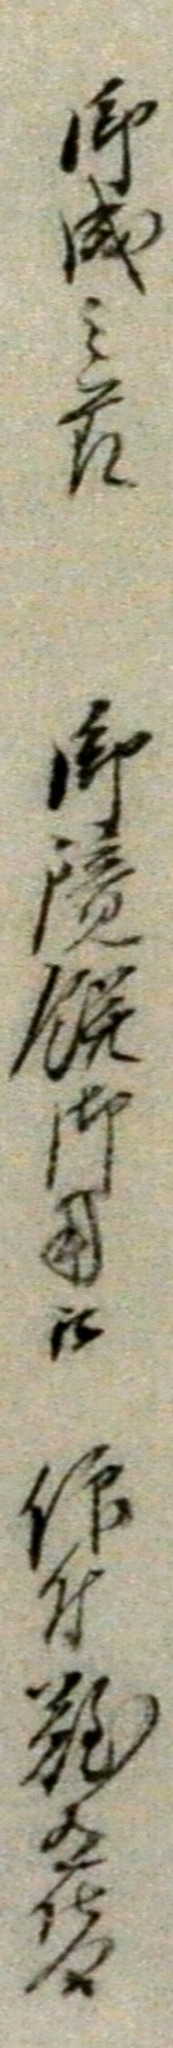御成之節御鏡餅御用被仰付難有仕合
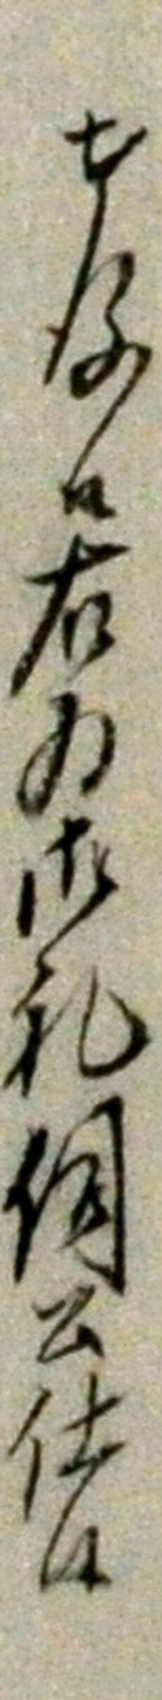奉存候右為御礼伺公仕候
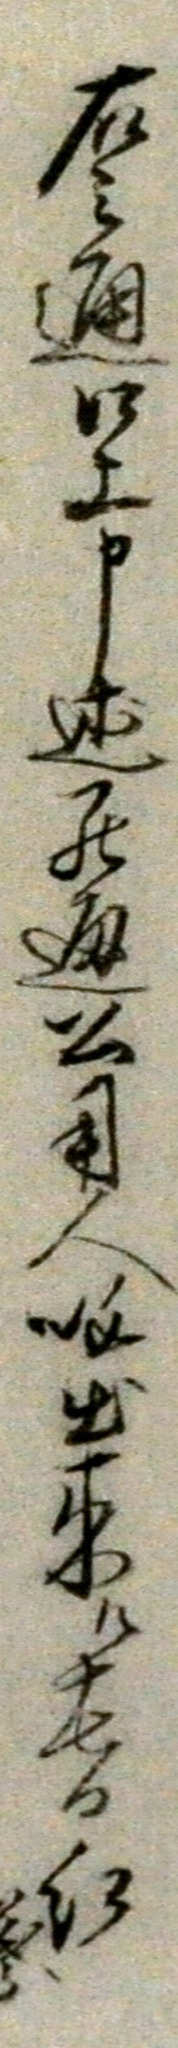右之通口上申述罷通公用人呼出来ル十七日紅葉
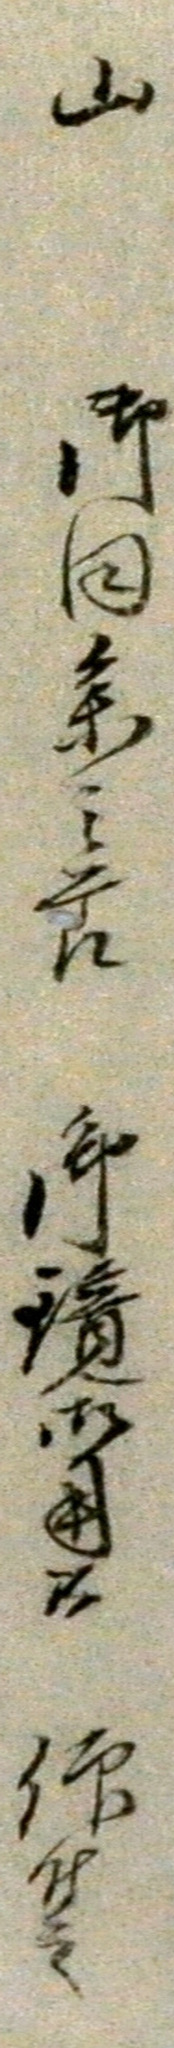山御同参之節御鏡御用被仰付之
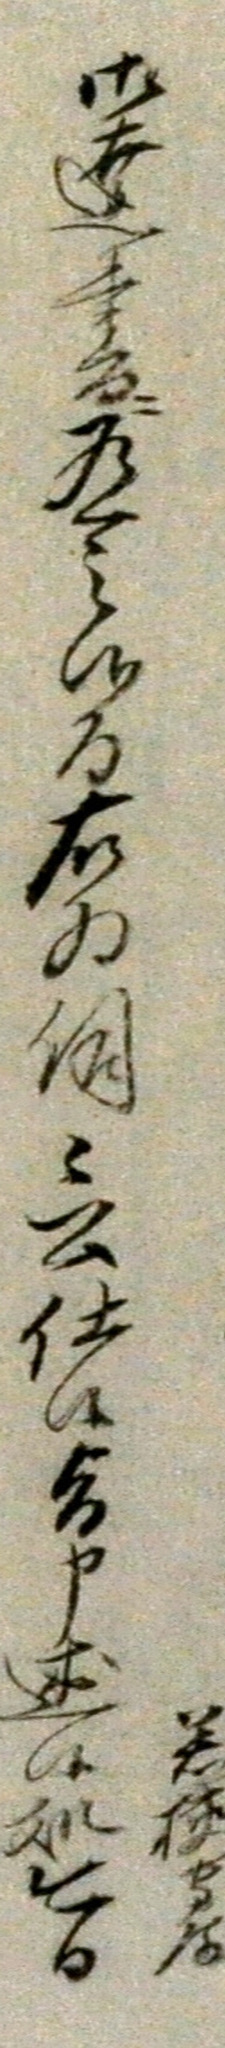御達書ニ有之候間右為伺々公仕候旨申述候処今日
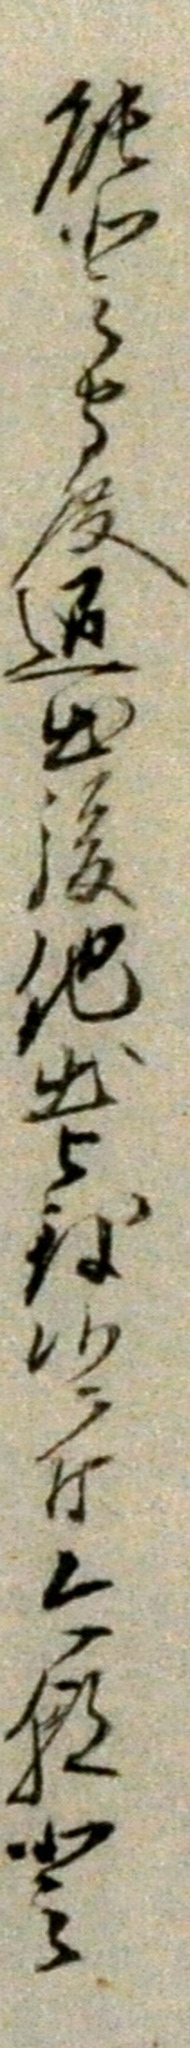能登守殿退出後他出被致候ニ付今朝登
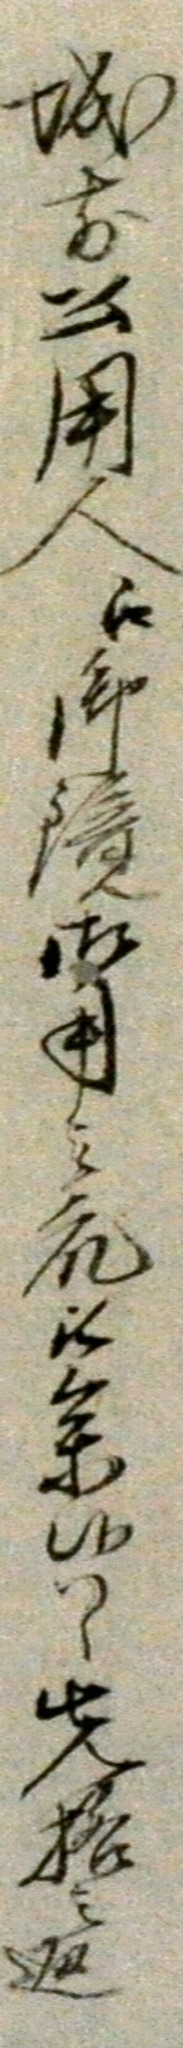城前公用人え御鏡御用之衆被参候ハヽ先格之通
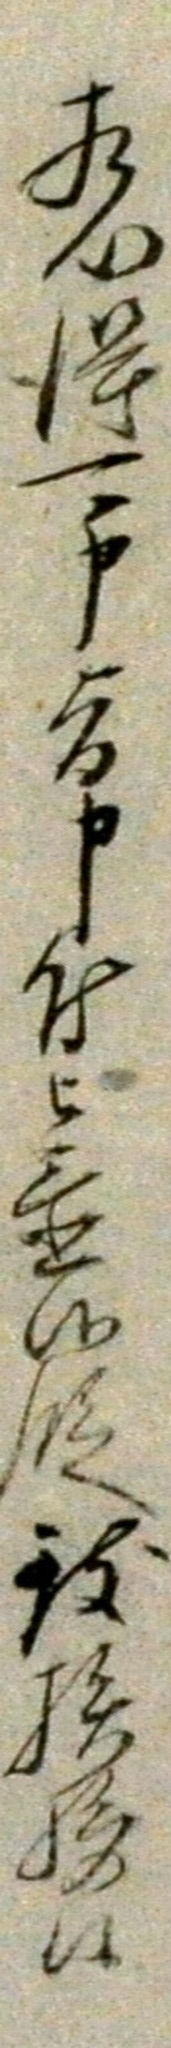相心得可申旨申付被置候段致挨拶候
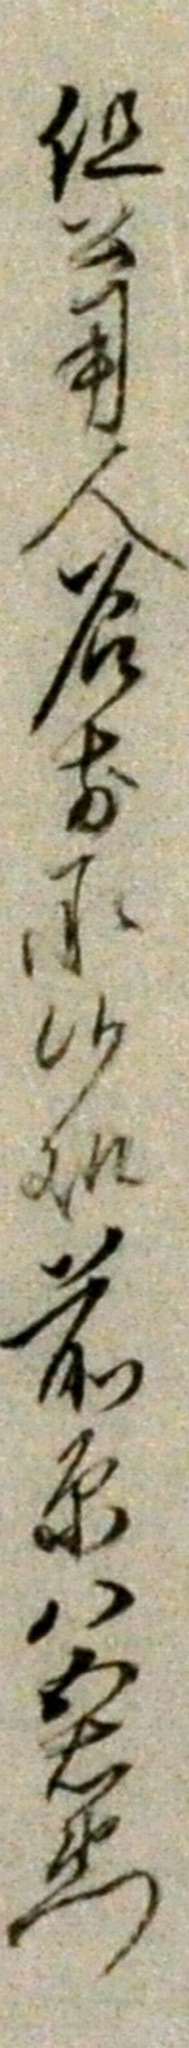但公用人名前承候処前原八五右衛門
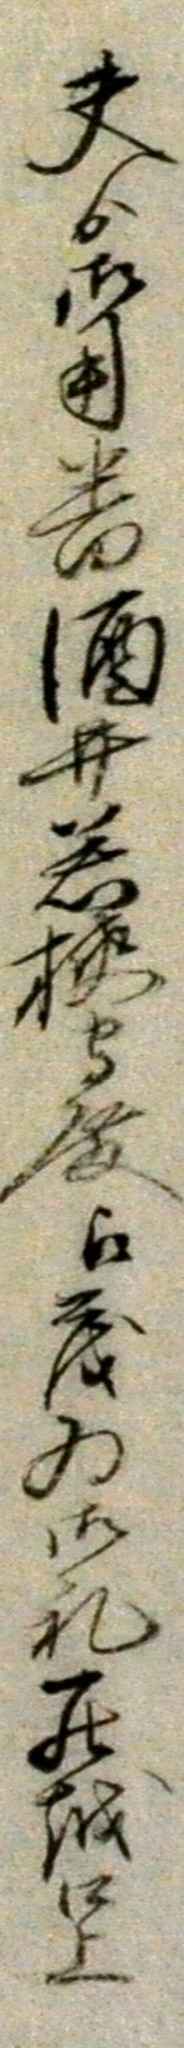夫ゟ御用番酒井若狭守殿えも為御礼罷越口上
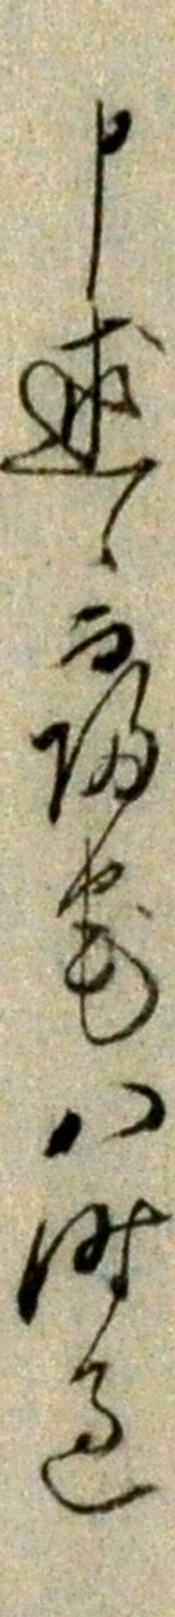申述候而帰宅八時過

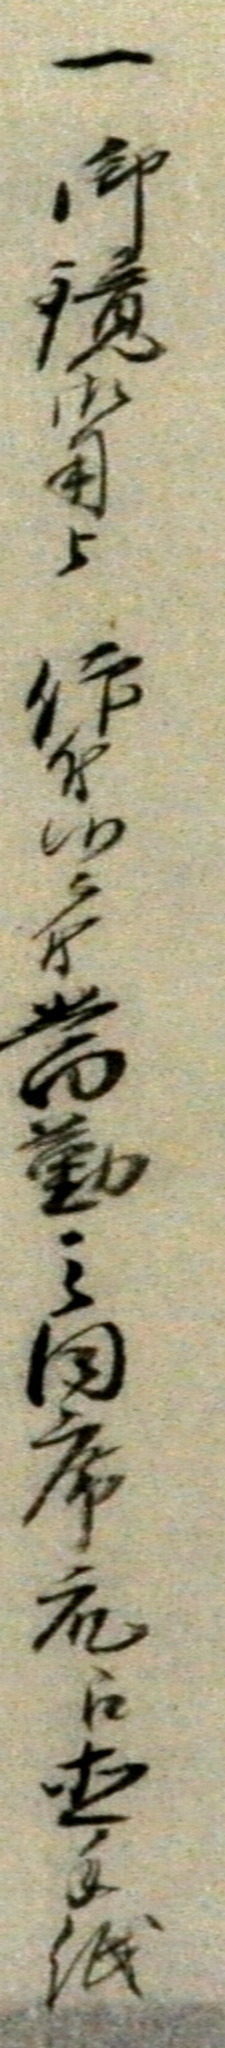一御鏡御用被仰付候ニ付当勤之同席衆え直手紙
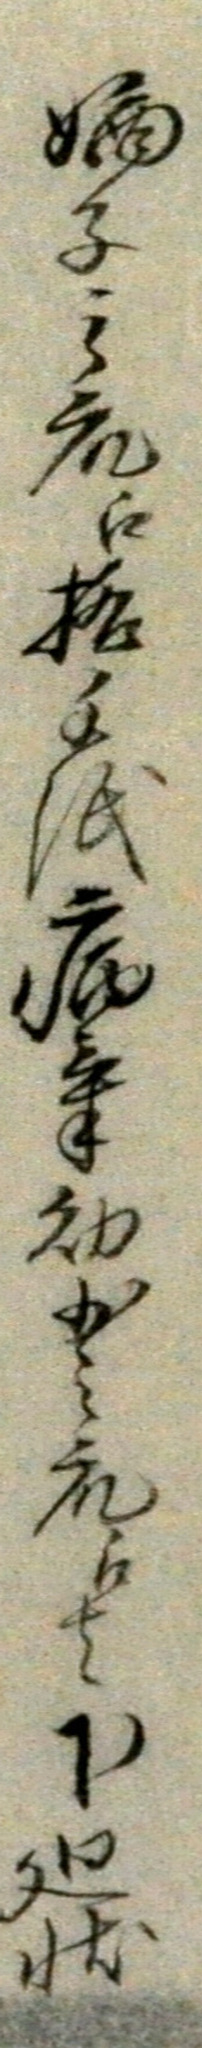嫡子之衆え据手紙病気幼少之衆えは下廻状
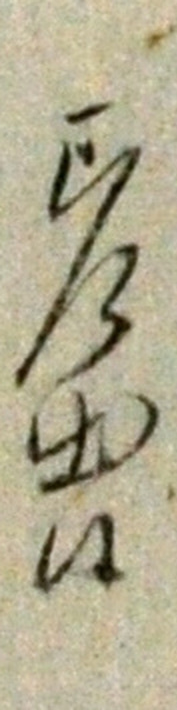差出候
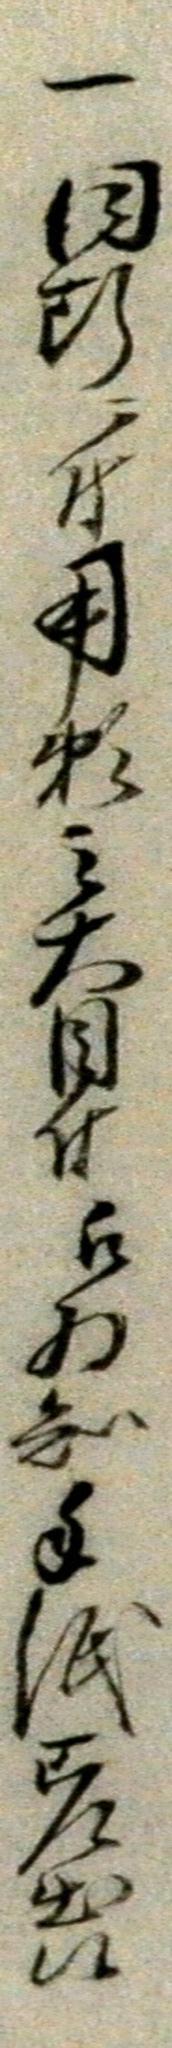一同断ニ付用頼之大目付え為知手紙差出候
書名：御鏡餅御用留（写）
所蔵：伊那市立高遠町図書館・合同会社AMANE
